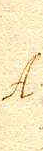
A
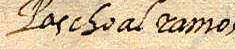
Paschoal ramos
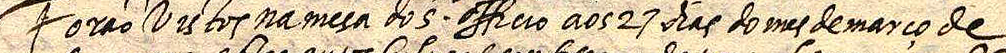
Foraõ vistos na mesa do s.to officio aos 27 dias do mes de março de
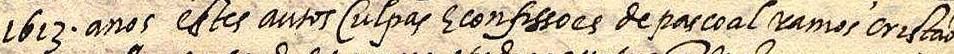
1613 anos estes autos Culpas E confissoes de pascoal ramos cristaõ
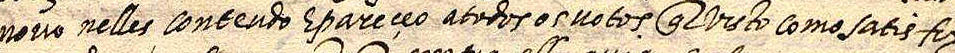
nouo nelles conteudo E pareceo a todos os uotos q̄ visto como satisfez
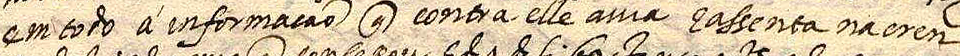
em todo á informaçaõ q̄ contra elle auia E assenta na cren
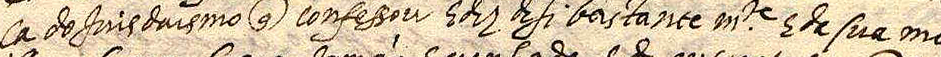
ça do Juisdaismo q̄ confessou E diz de si bastantem.te E de sua mo
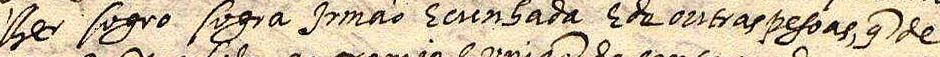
lher sogro sogra Jrmaõ E cunhada E de outras pesoas, q̄ de
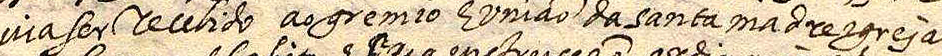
uia ser recebido ao gremio E vnião da santa madre igreja
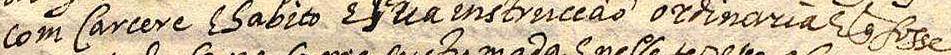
com Carcere E habito E hua instrucção ordinaria E q̄ fosse
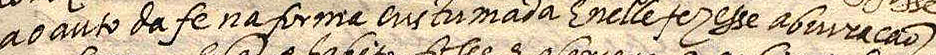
ao auto da fe na forma custumada E nelle fezesse abiuração
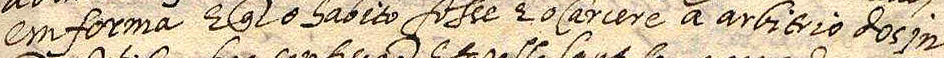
em forma E q̄ o habito fosse E o Carcere a arbitrio dos jn
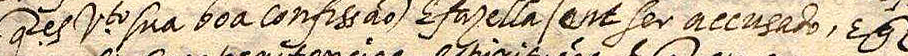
q̄.res v.to sua boa confissão E fazella sem ser accusado, E q̄
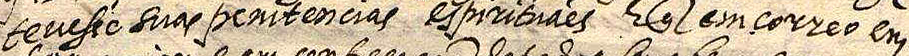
teuesse suas penitencias espirituāes E q̄ emcorreo em
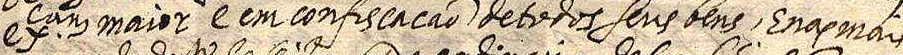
ex.çam maior e em confiscação de todos seus bens, E nas mais
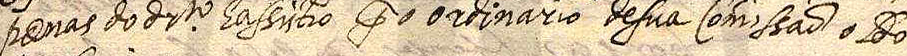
penas do dr.to E assistio p̄o ordinario de sua Confissaõ o Ldo
